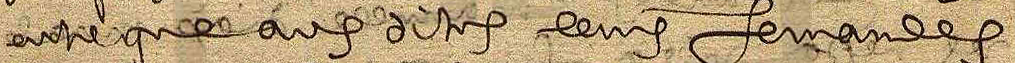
entregue aos ditos lluis fernandes
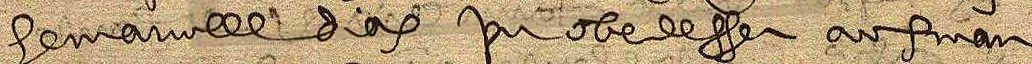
he manoell dias por obedesser aos man
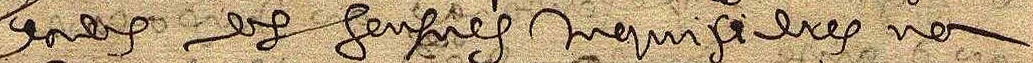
dados dos senhores Inquisidores na
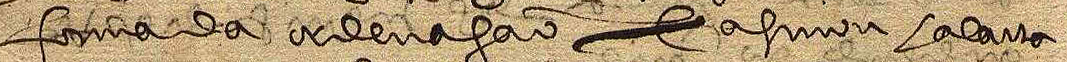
forma da ordenasaõ E asinou E a carta
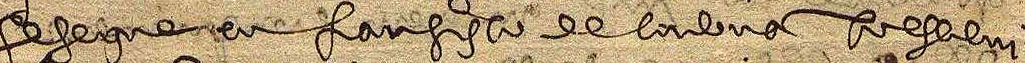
se segue eu fransisco de cordoua ho escreui
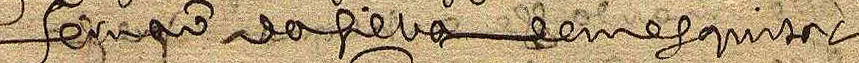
fernaõ da silua de mesquita/
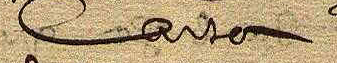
Carta
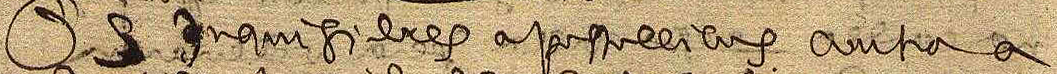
Os Jnquisidores apostollicos contra a
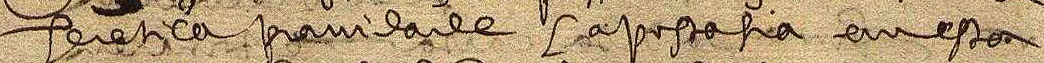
heretica prauidade E apostasia em esta
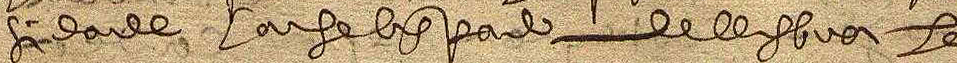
sidade E arsebispado de llisboa he
